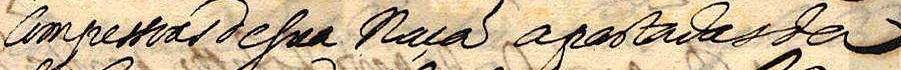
com pessoas de sua Naçaõ apartadas da
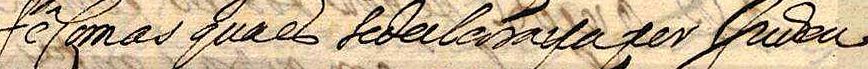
fê Com as quaes se declaraua per Judeu
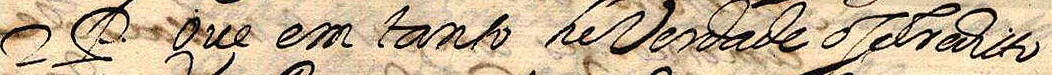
2 P Que em tanto he Verdade o sobredito
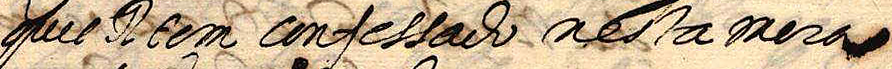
que o R tem confessado nesta meza
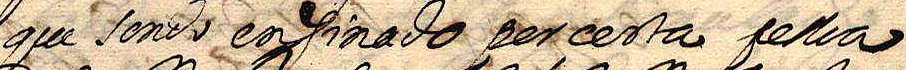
que sendo ensinado per çerta pessoa
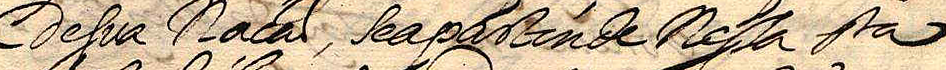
de sua Naçaõ, se apartou de Nossa sta
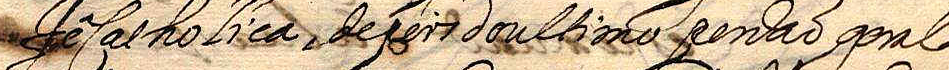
fê Catholica, depois do ultimo perdaõ geral
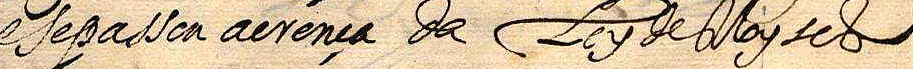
e se passou a crença da Ley de Moyses
